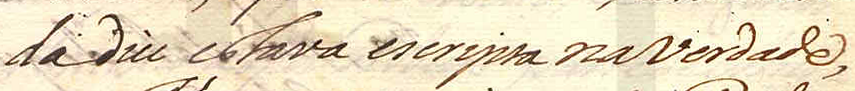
da dice estava escripta na verdade,
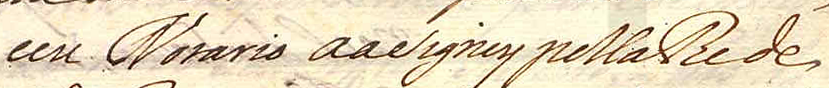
e eu Notario a asigney pella Re de
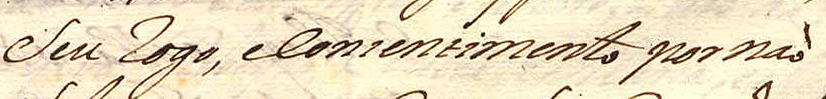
Seu Rogo, e consentimento por naõ
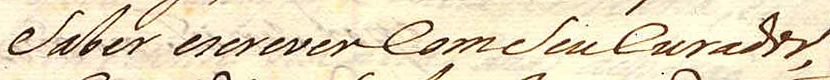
saber escrever com Seu Curador,
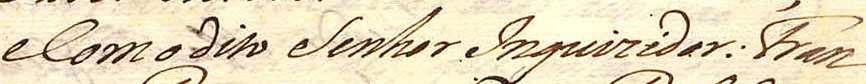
e Com o dito Senhor Inquizidor: Fran
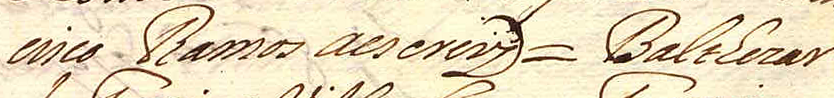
cisco Ramos o escrevj = Balthezar
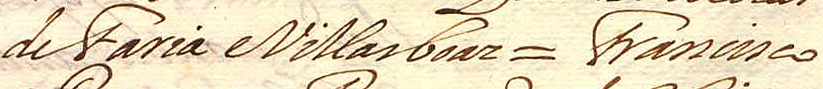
de Faria e Villas boaz = Francisco
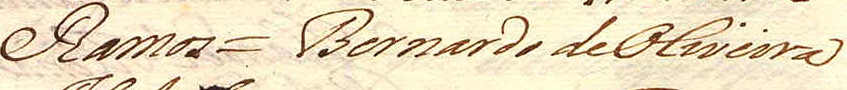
Ramos = Bernardo de Oliveira
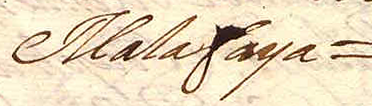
Malafaya =
